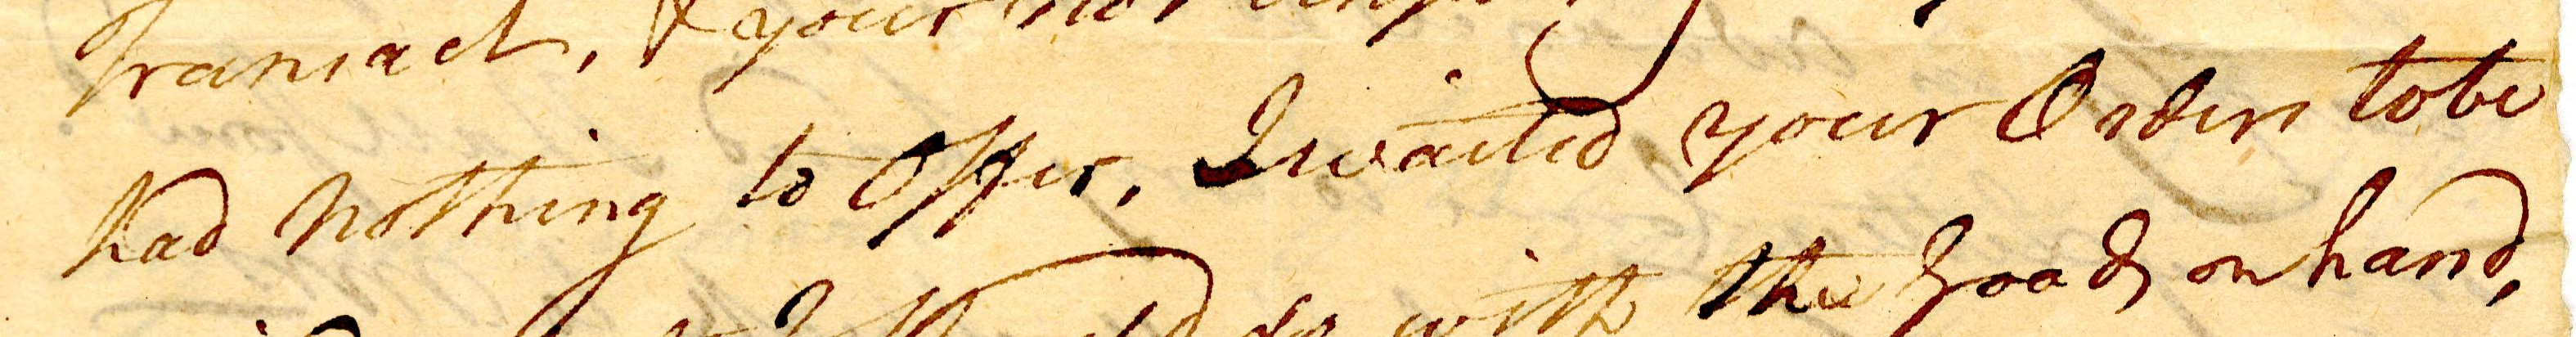had nothing to Offer, I waited your Orders to be
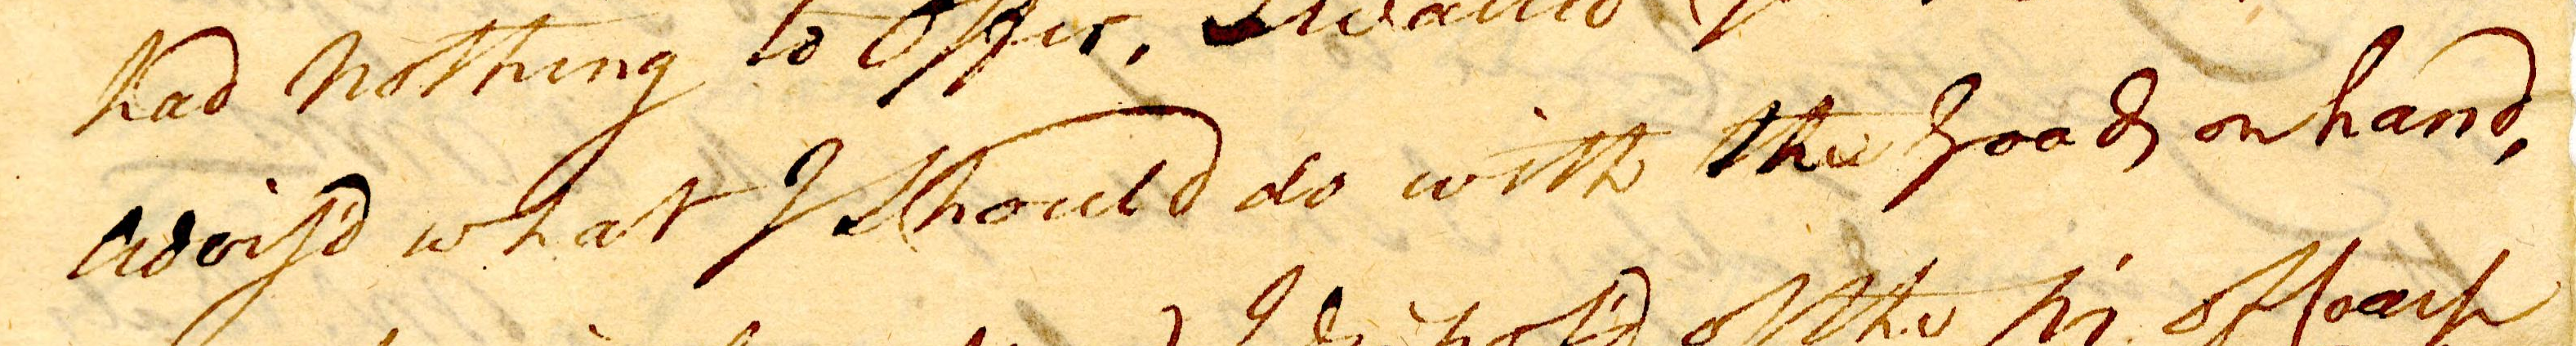advisd what I should do with the goods on hand,
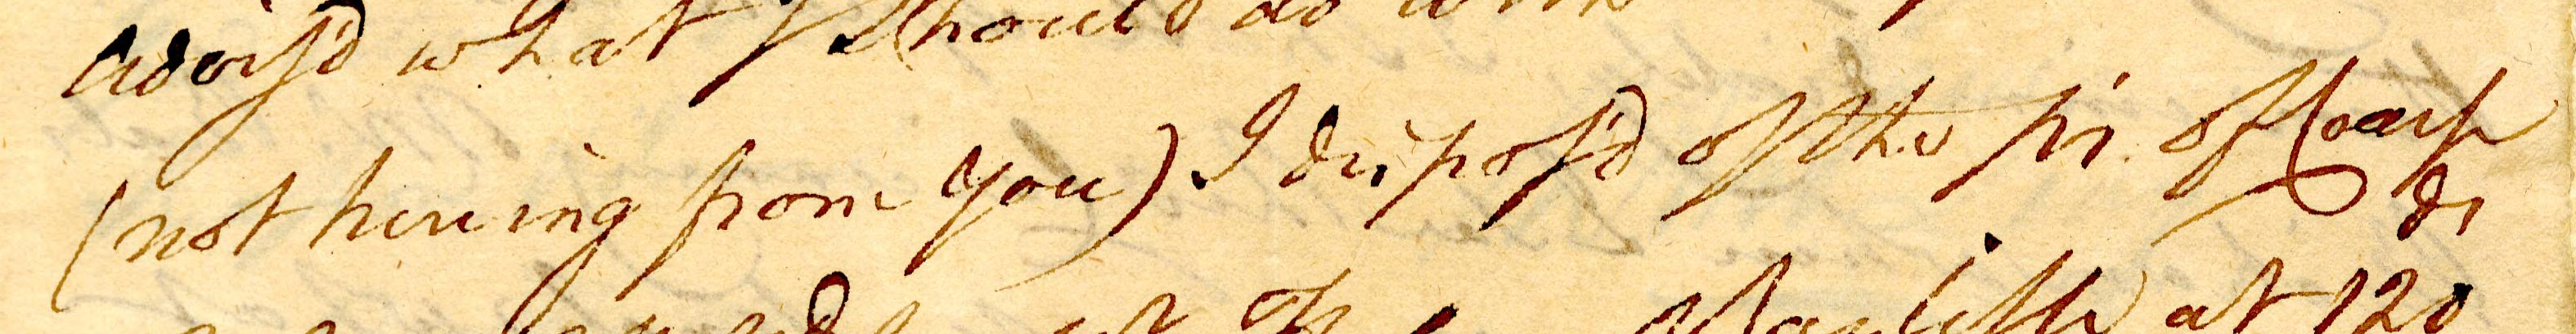(not hearing from you) I dispos'd of the pi of Coarse
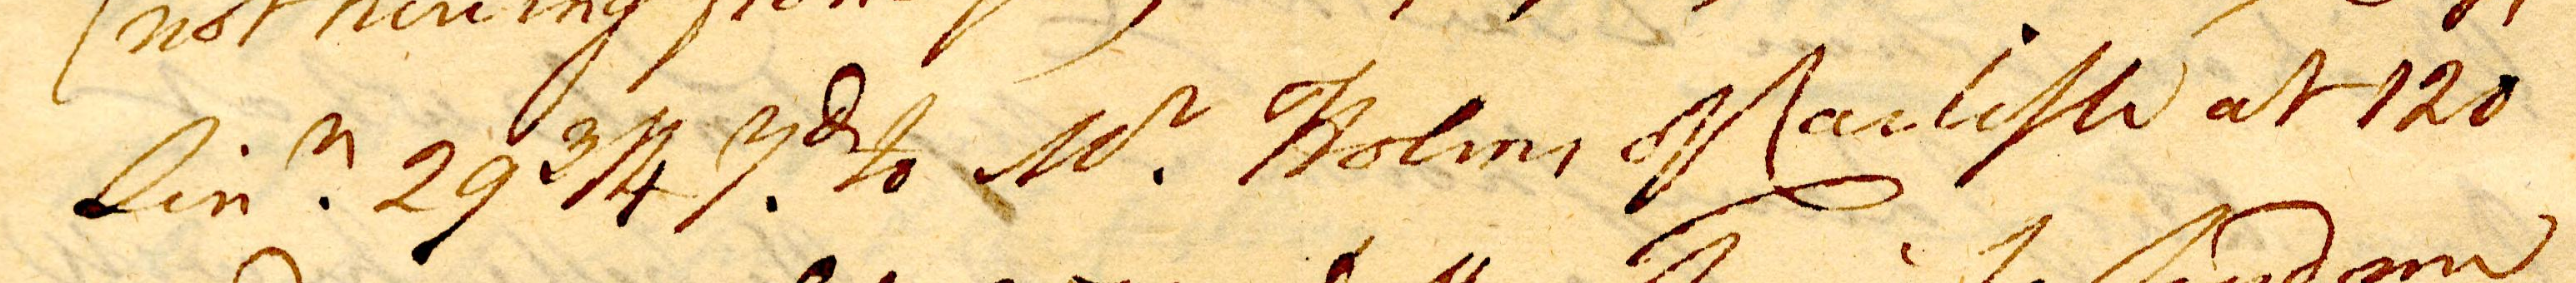Lin^n. 29 3/4 y^d. to M^r. Holms of Carlisle at 120
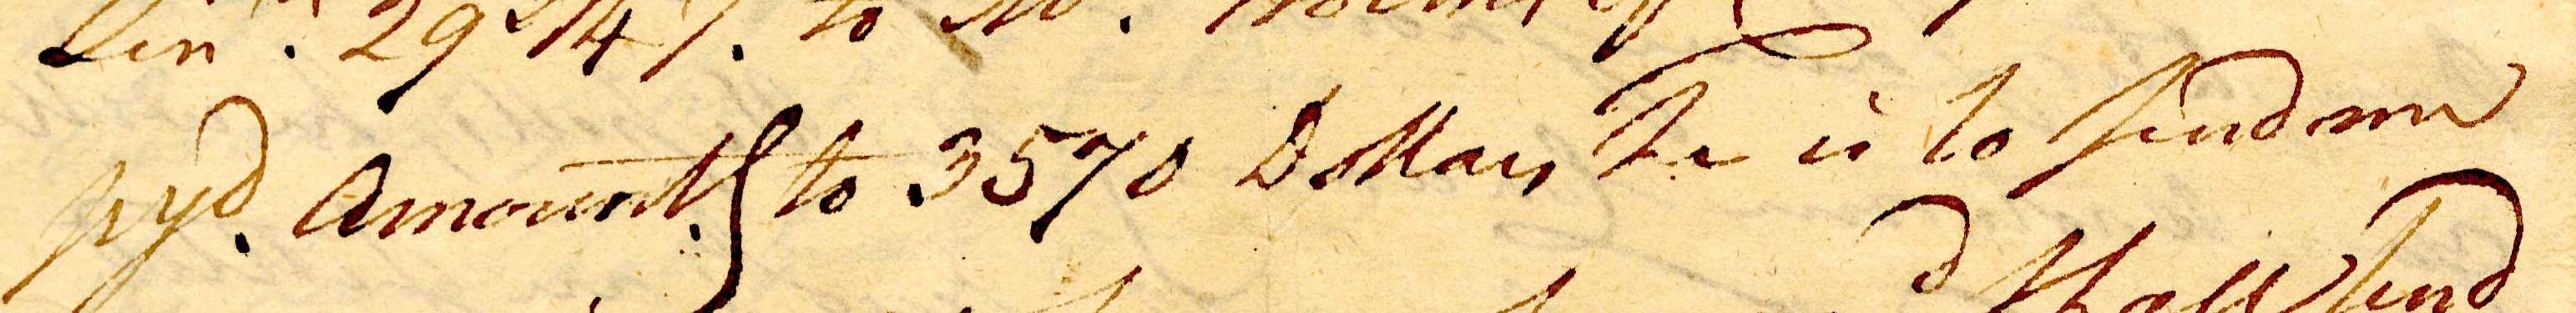p^r y^d. Amount^g to 3570 Dollars he is to send me
